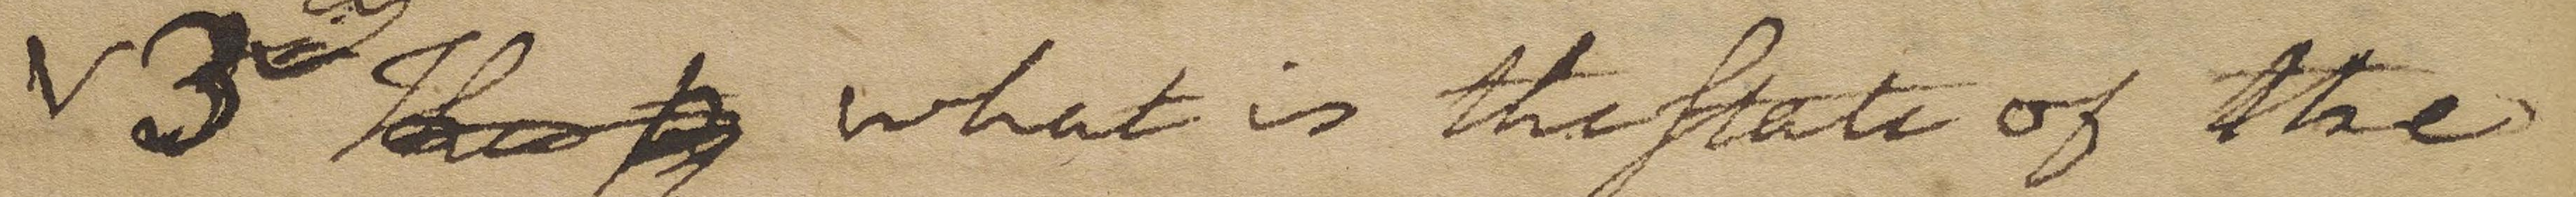V 3^ly [The __] what is the State of the
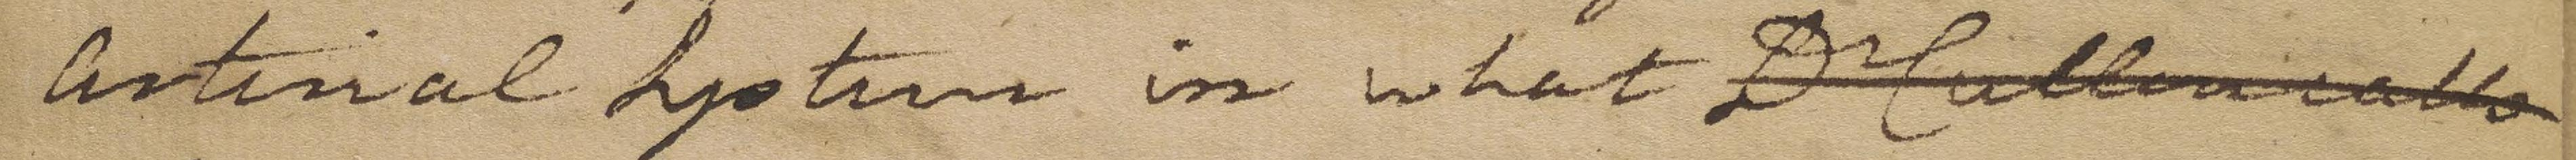arterial System is what [D^r Cullen calls]
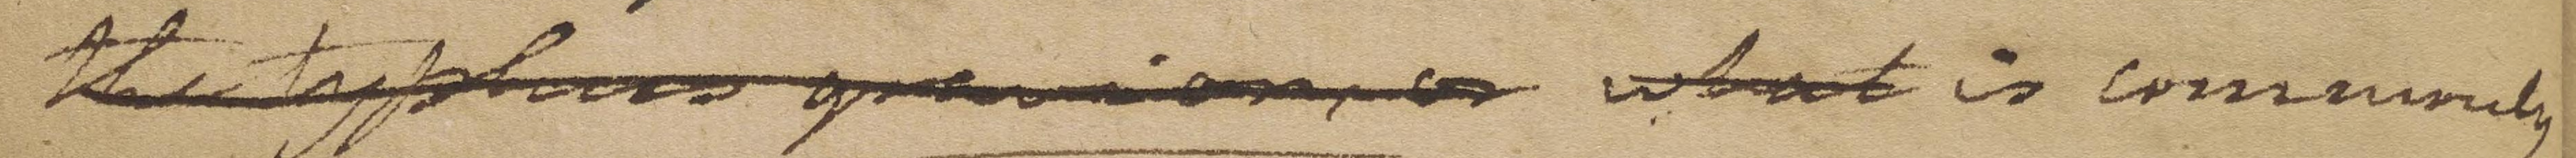[the typhus gravior, or] [what] is commonly
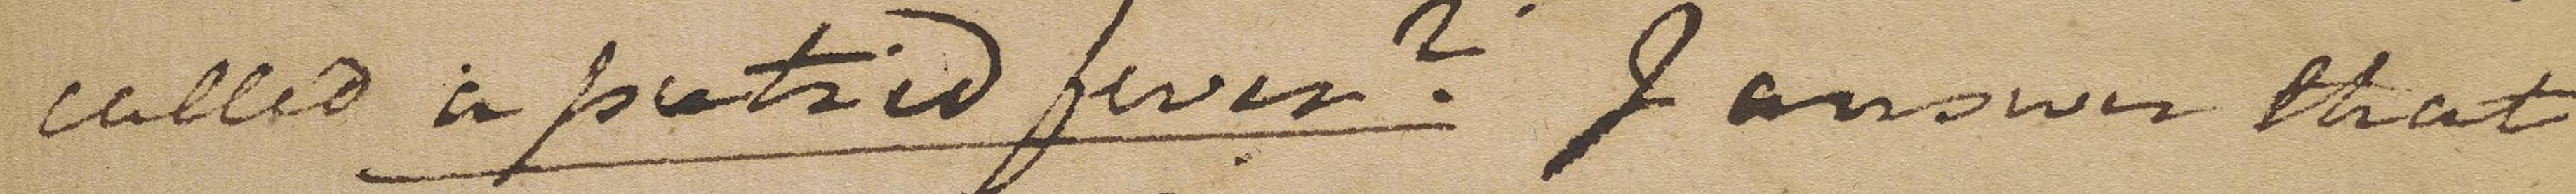called a putrid fever? I answer that
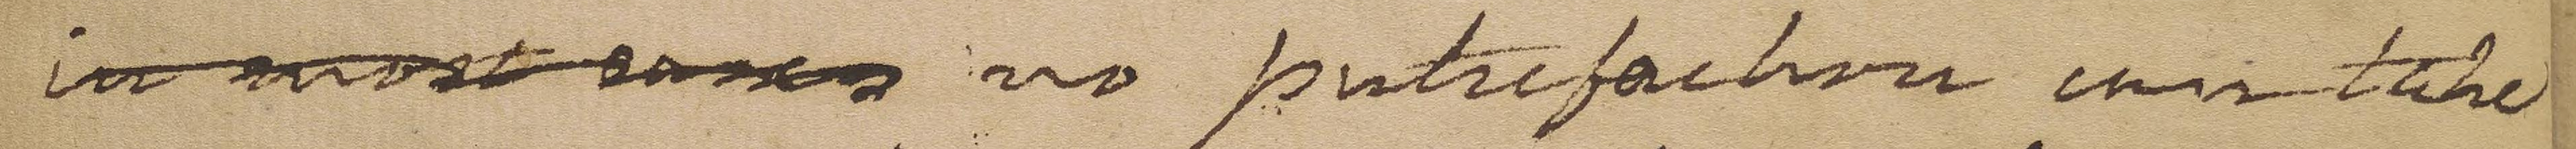[in most cases] no putrefaction can take
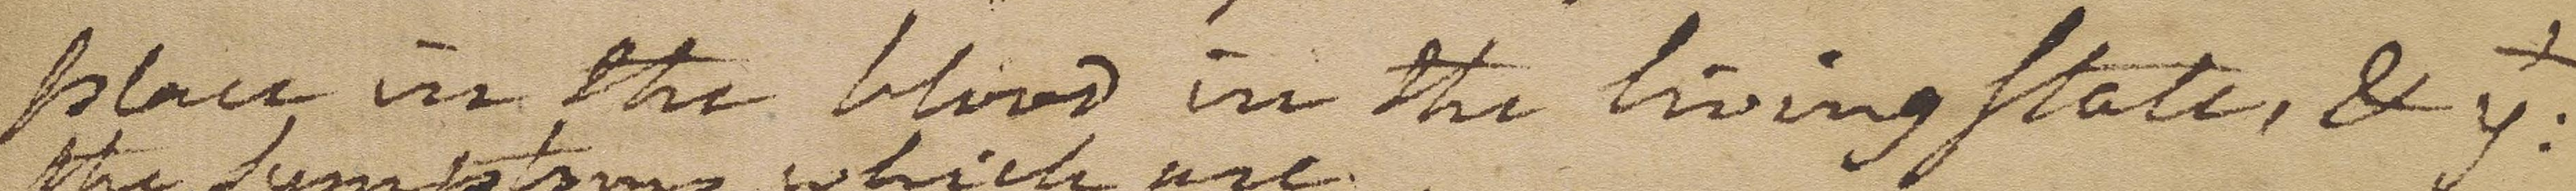place in the blood in the living state, & y^t
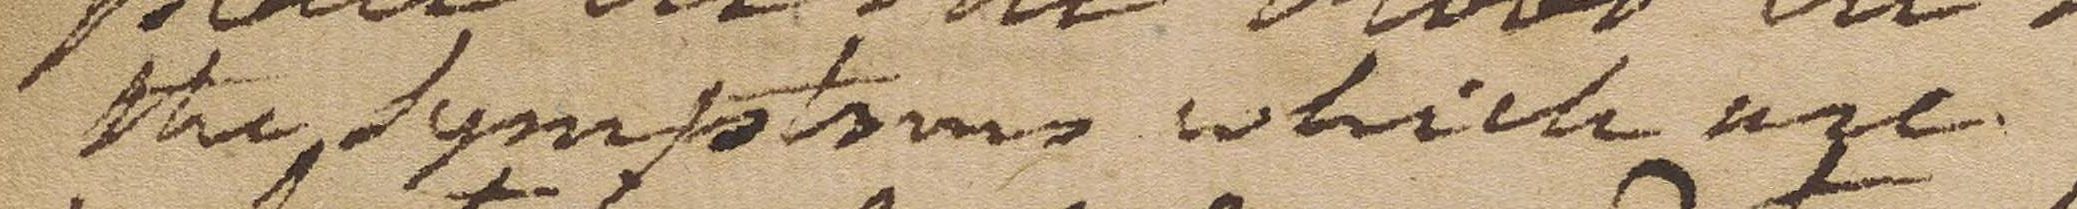the Symptoms which are
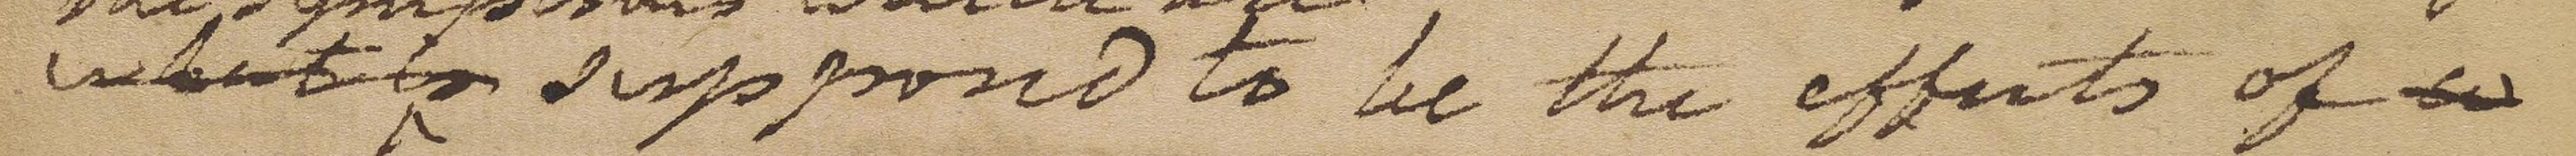what is ^ supposed to be the effects of a
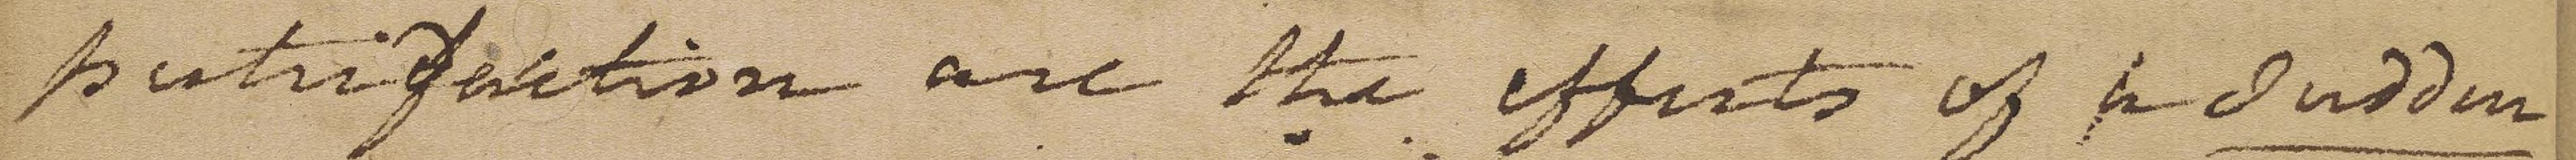putrid action are the effects of a sudden
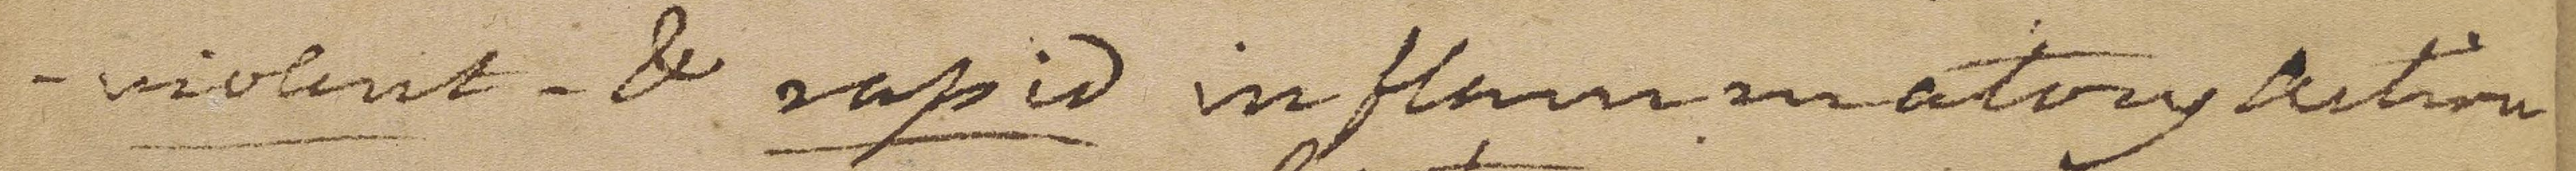violent, & rapid inflammatory action
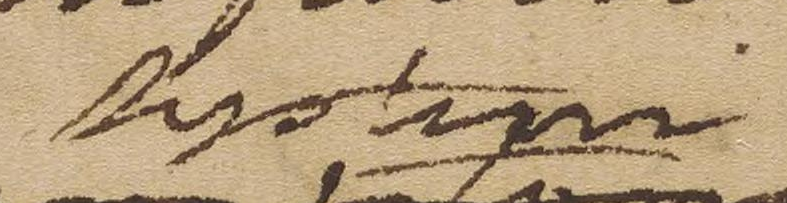System
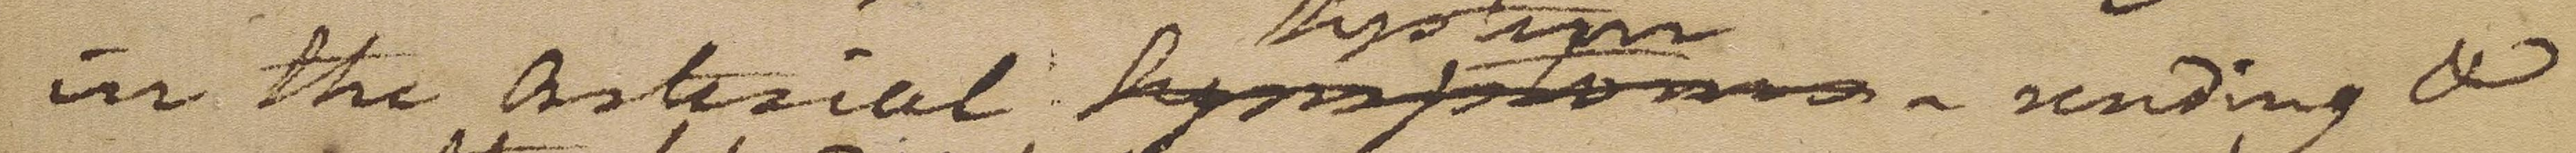in the arterial [symptoms], rending &
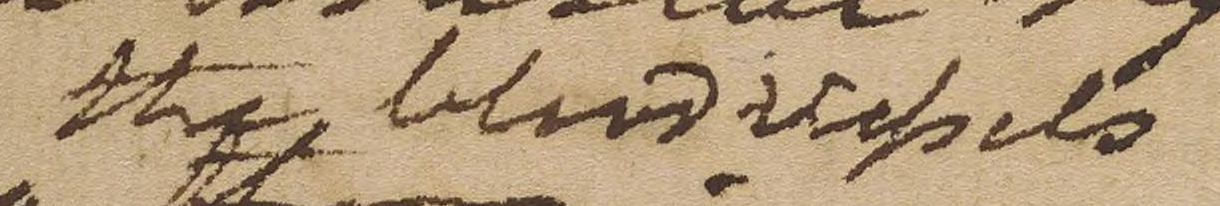the blood vessels
